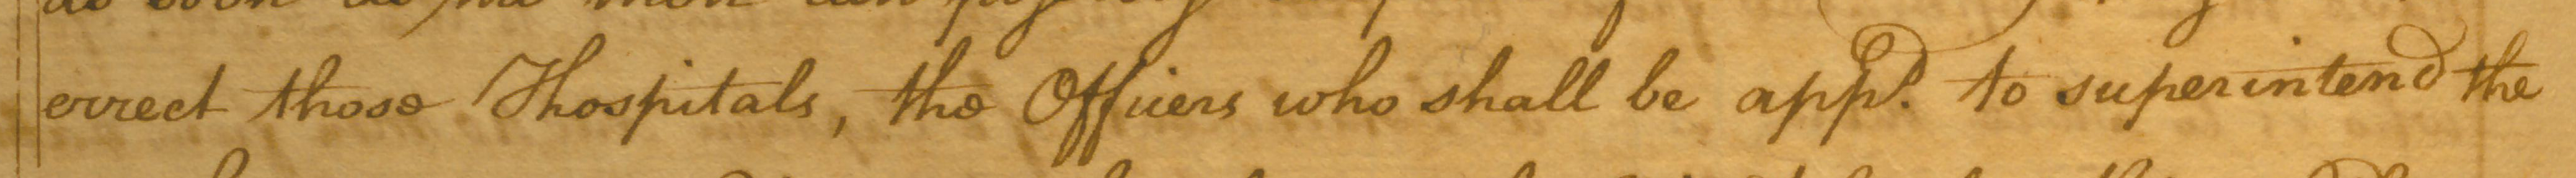errect those Hospitals, the Officers who shall be app^d. to superintend the
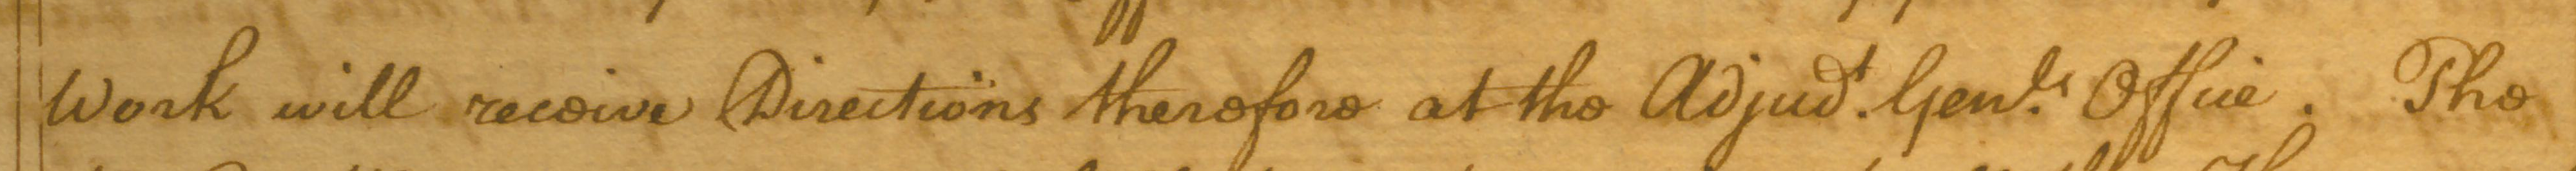Work will receive Directions therefore at the Adjud^t. Gen^ls. Office. The
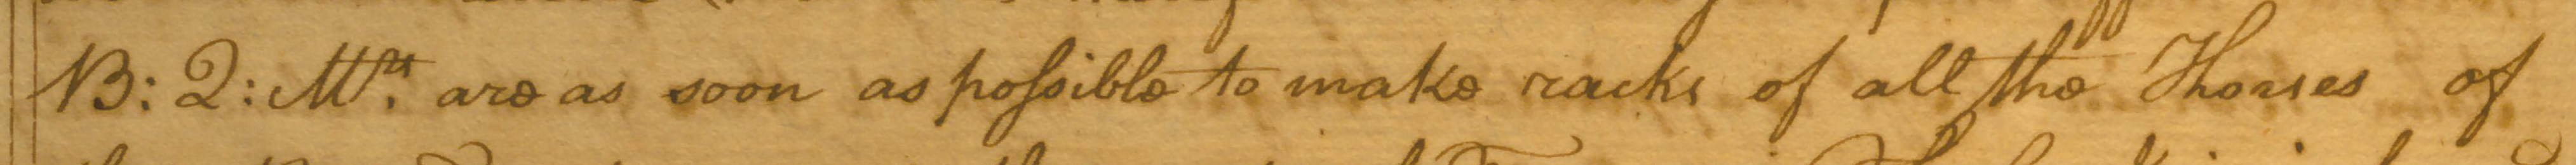B: Q: M^r. are as soon as possible to make racks of all the Horses of
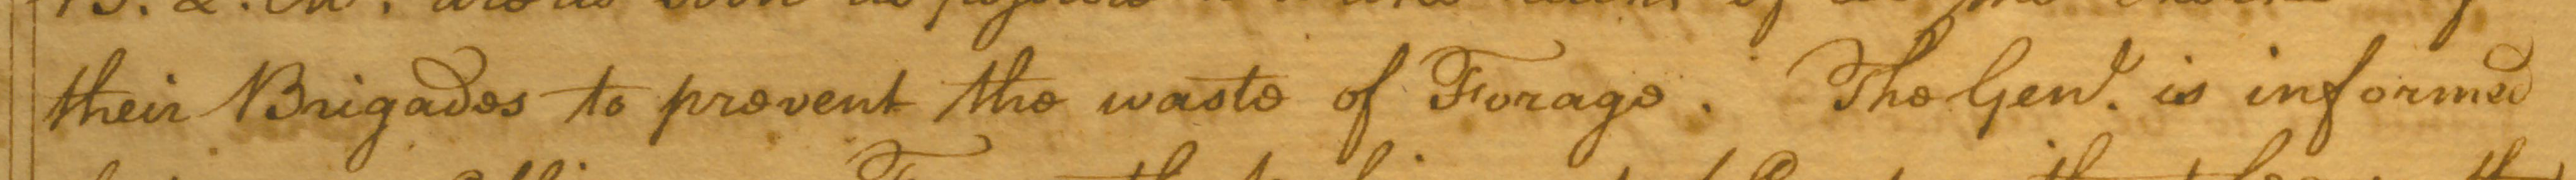their Brigades to prevent the waste of Forage. The Gen^l. is informed
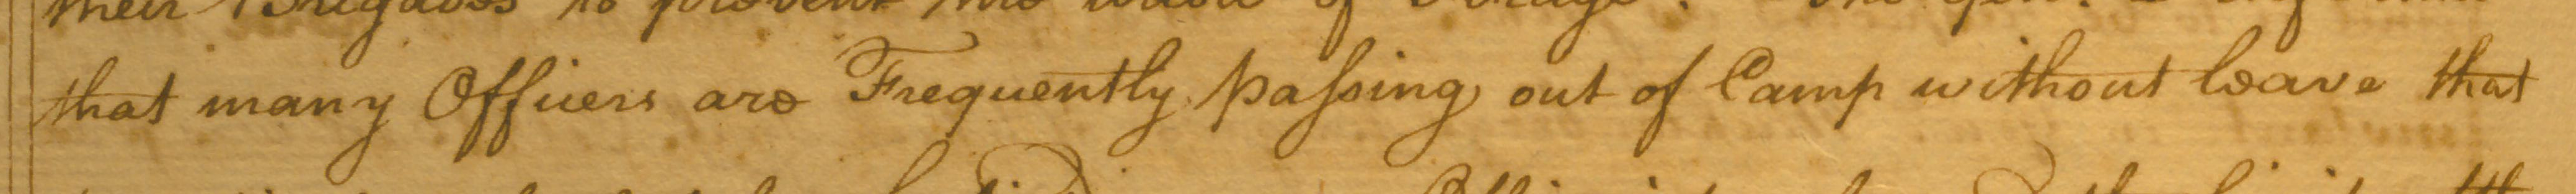that many Officers are Frequently passing out of Camp without leave that
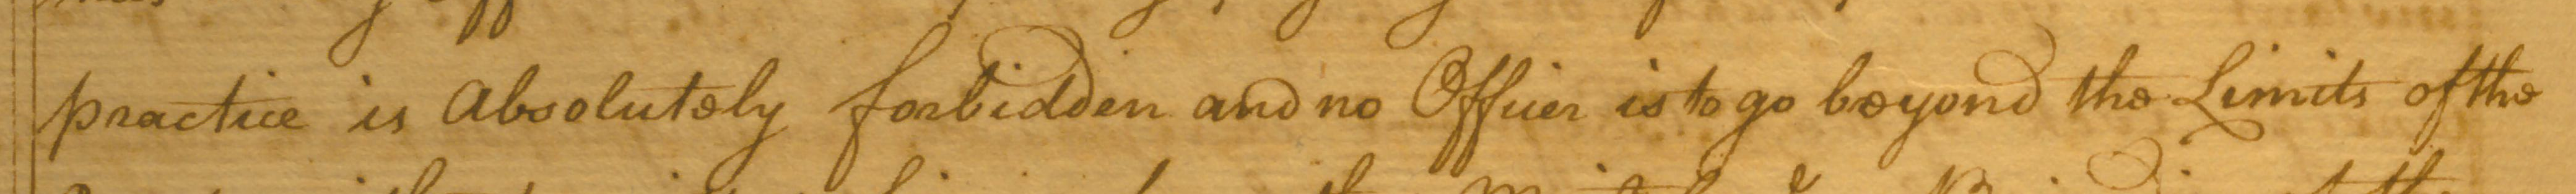practice is Absolutely forbidden and no Officer is to go beyond the Limits of the
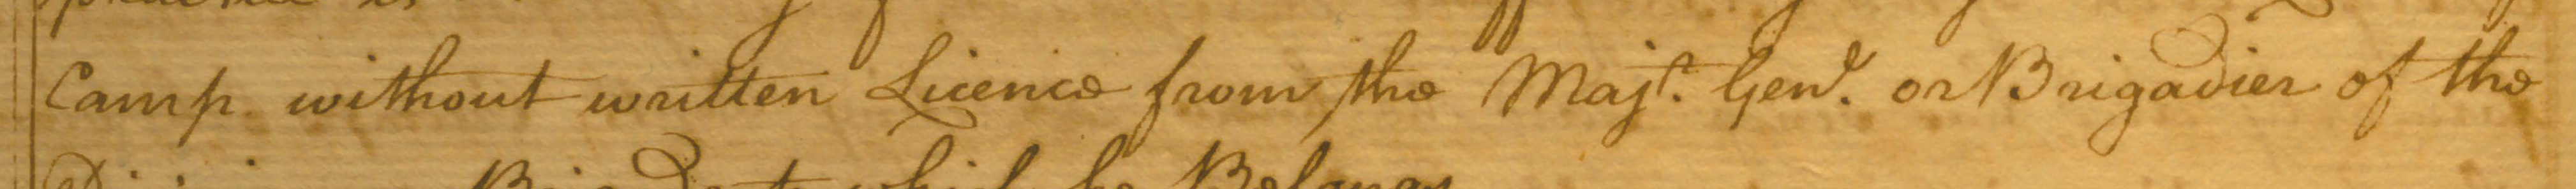Camp without written License from the Maj^r. Gen^l. or Brigadier of the
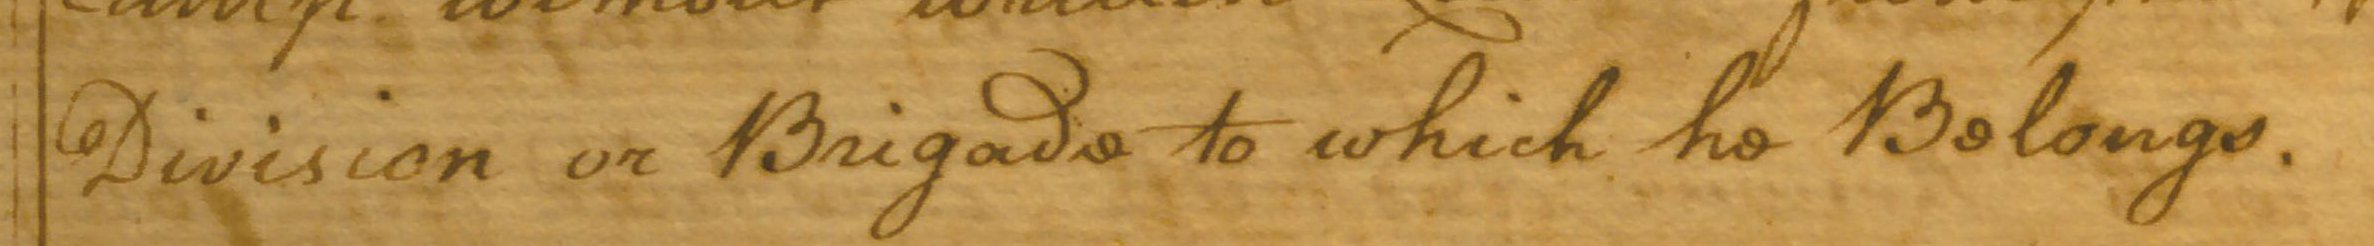Division or Brigade to which he Belongs.
